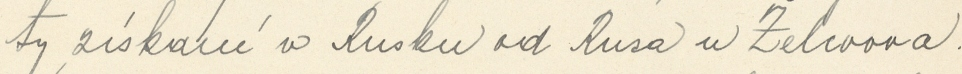ty získané v Rusku od Rusa u Želwova.
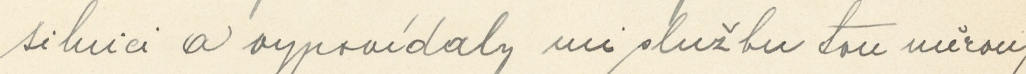silnici a vypovídaly mi službu tou měrou,
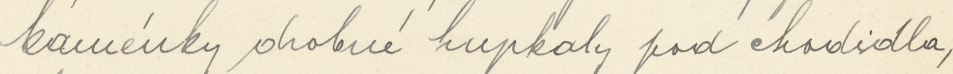kaménky drobné hupkaly pod chodidla,
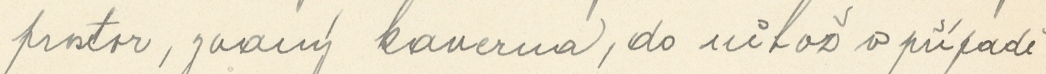prostor, zvaný kaverna, do něhož v případě
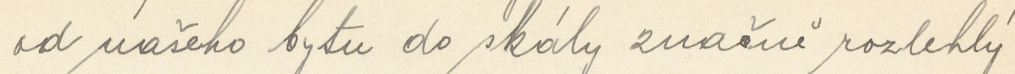od našeho bytu do skály značně rozlehlý
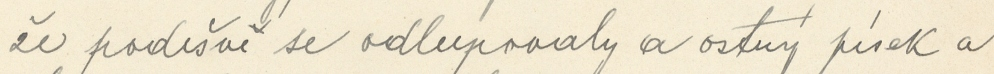že podešvě se odlupovaly a ostrý písek a
